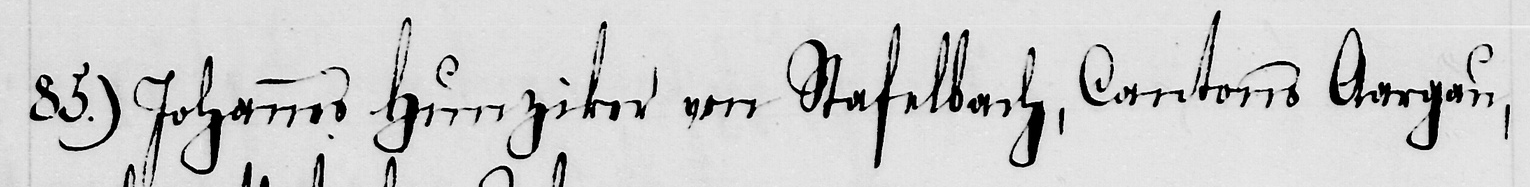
85.) Johannes Hunziker von Stafelbach, Cantons Aargau,
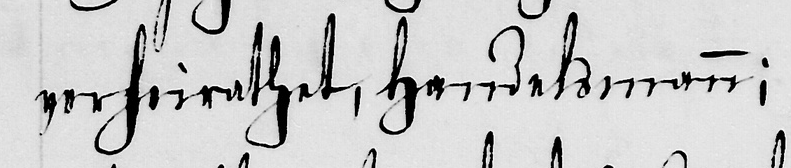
verheirathet, Handelsmann;
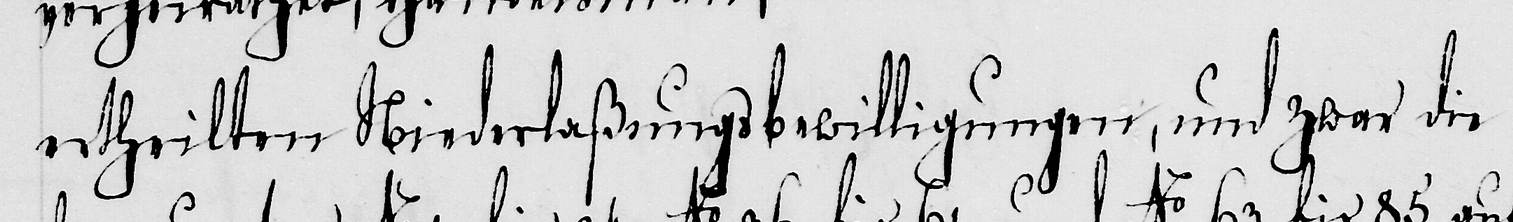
ertheilten Niederlaßungsbewilligungen, und zwar die
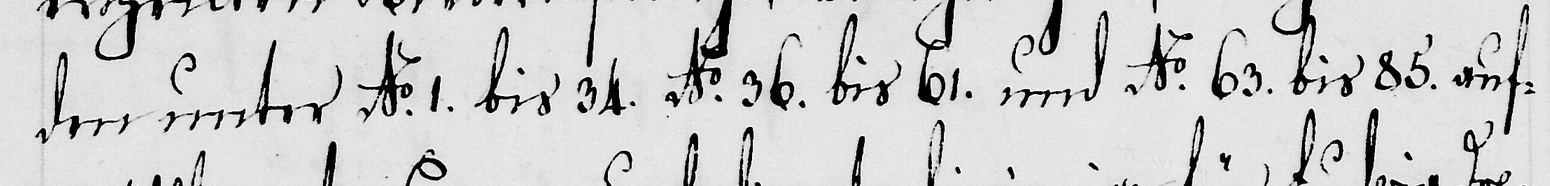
den unter No. 1. bis 34. No. 36 bis 61. und No. 63. bis 85. auf¬
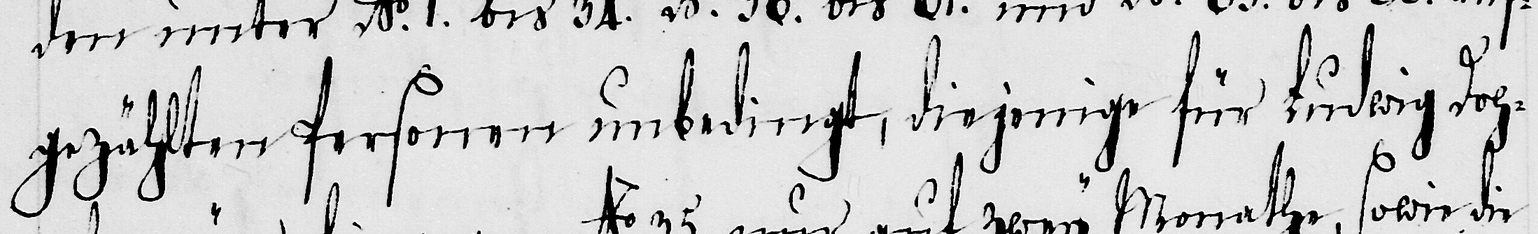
gezählten Personen unbedingt, diejenige für Ludwig Dop¬
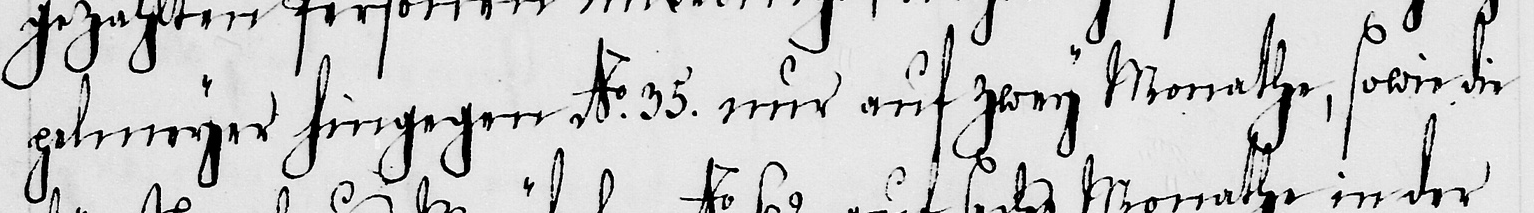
pelmeyer hingegen No. 35. nur auf zwey Monathe, sowie die
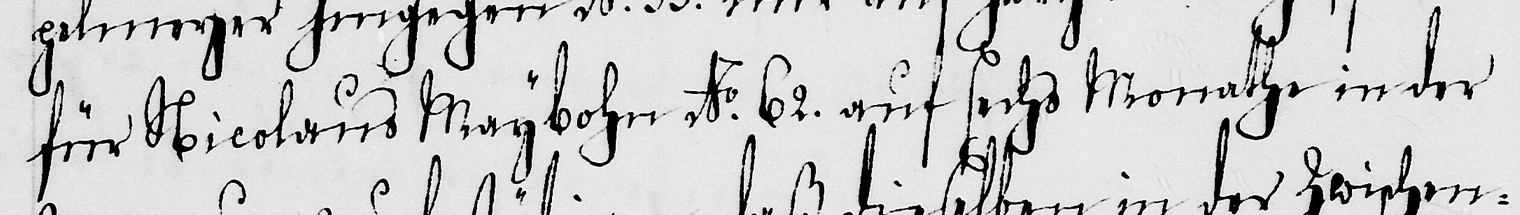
für Nicolaus Maybohn No. 62. auf sechs Monathe in der
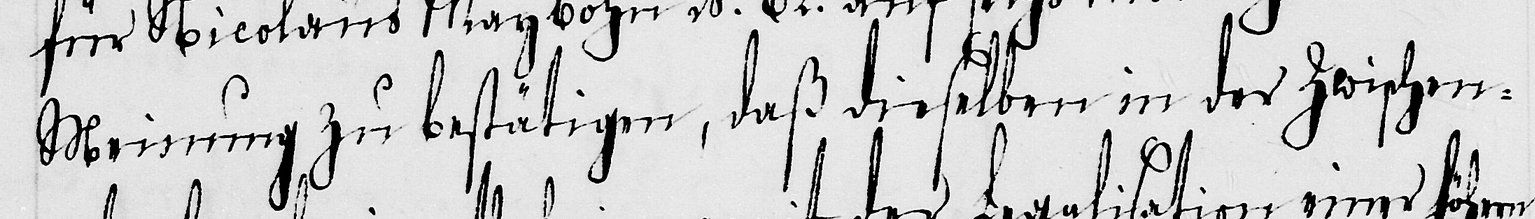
Meinung zu bestätigen, daß dieselben in der Zwischen¬
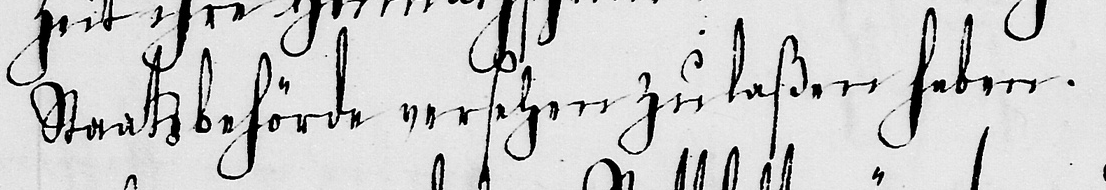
Staatsbehörde versehen zu laßen haben.
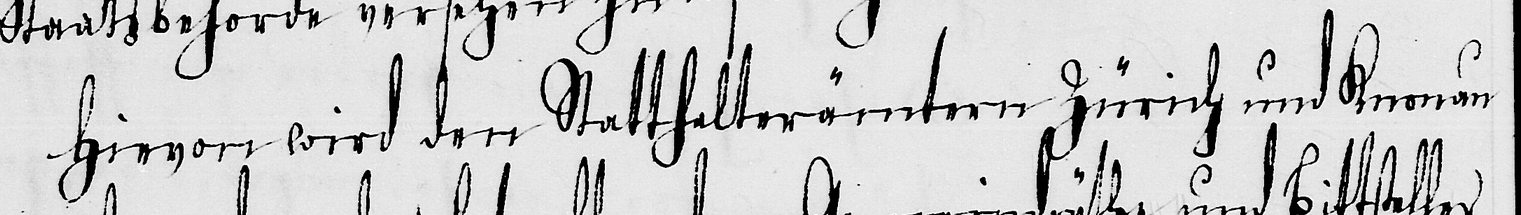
Hievon wird den Statthalterämtern Zürich und Knonau
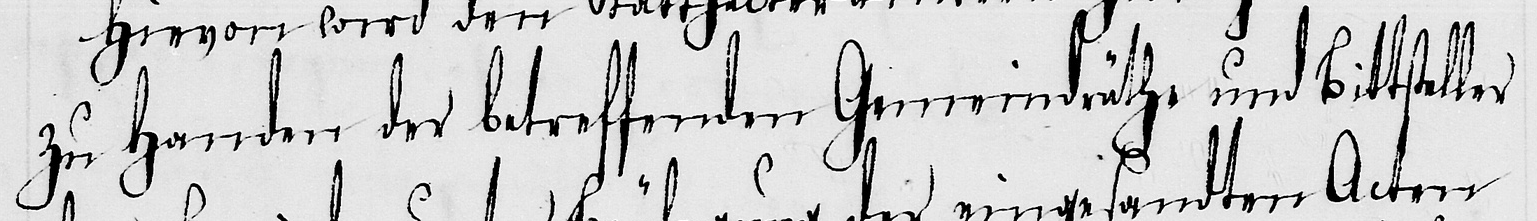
zu Handen der betreffenden Gemeindräthe und Bittstel¬
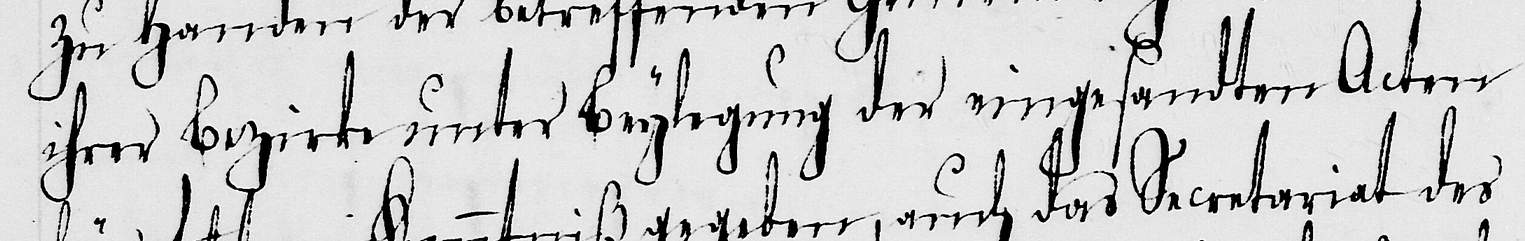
ihrer Bezirke unter Beylegung der eingesandten Acten
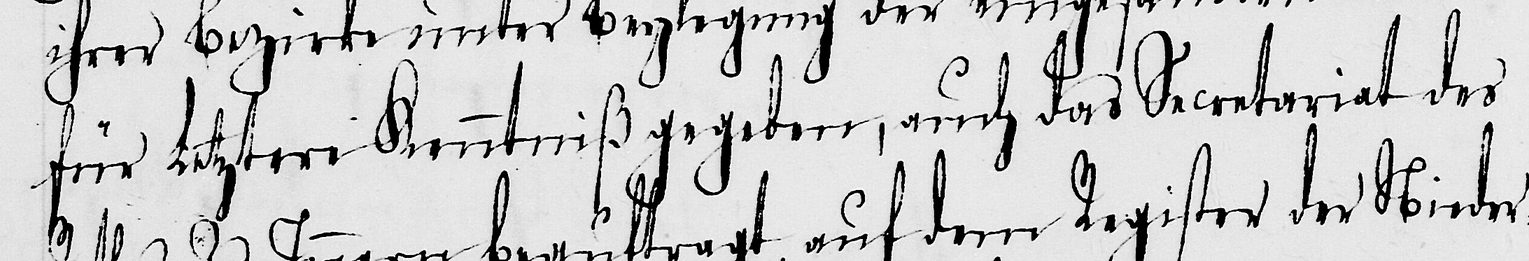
für Letztere Kenntniß gegeben, auch das Secretariat des
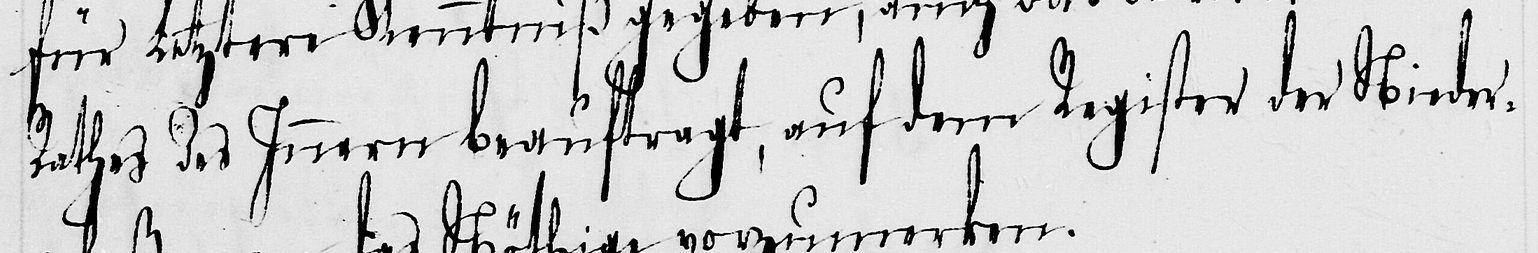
Rathes des Innern beauftragt, auf dem Register der Nieder¬
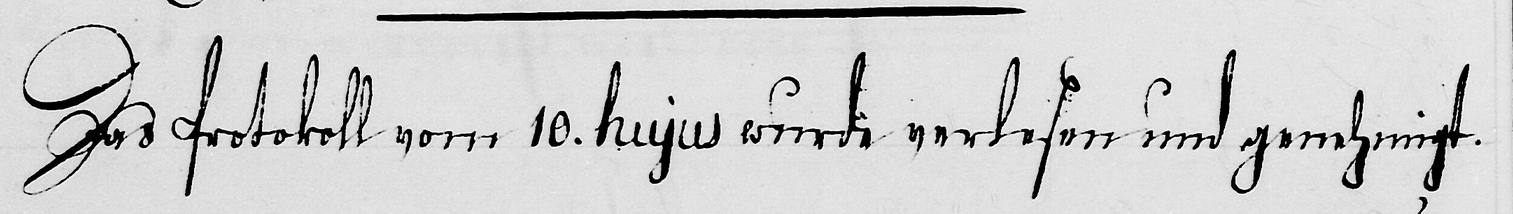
Protokoll vom 10. hujus wurde verlesen und genehmigt.
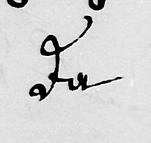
Das
